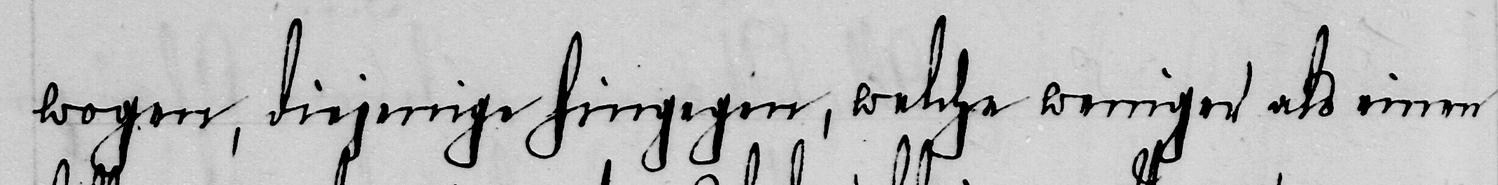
wogen, diejenigen hingegen, welche weniger als einen
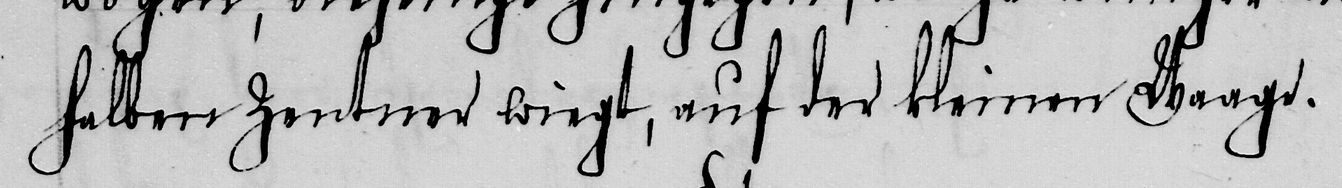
halben Zentner wiegt, auf der kleinen Waage.
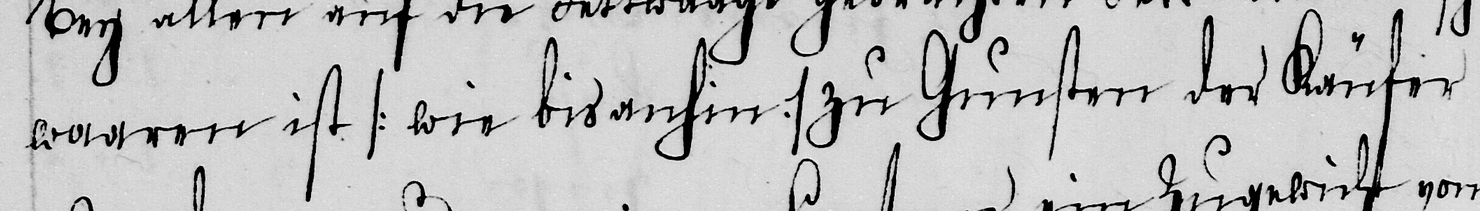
waaren ist [wie bis anhin] zu Gunsten der Käufer
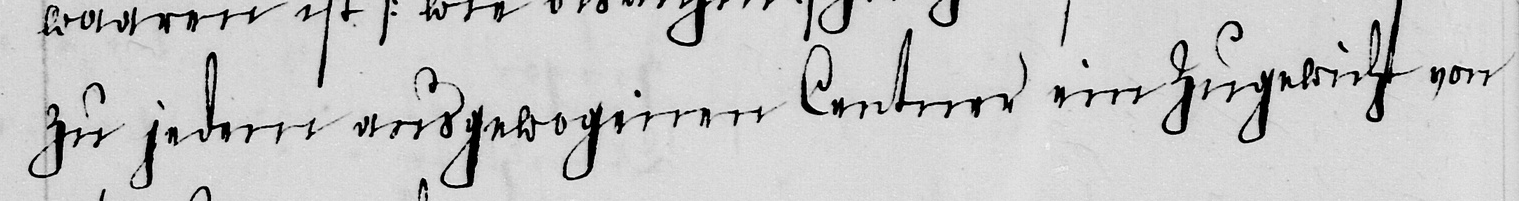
zu jedem ausgewogenen Centner ein Zugewicht von
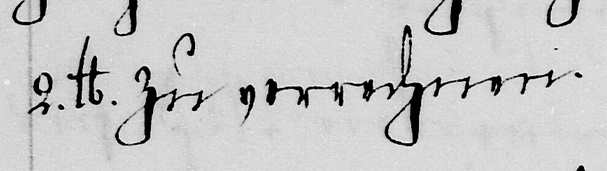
2. lb. zu verrechnen.
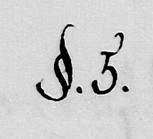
§. 5.
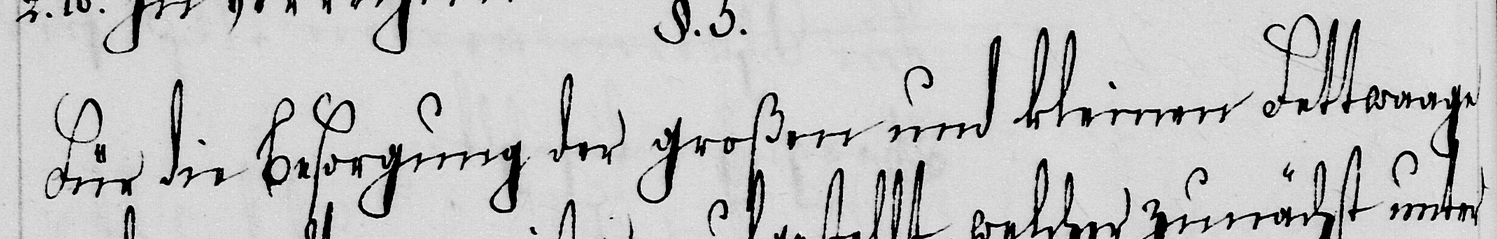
Für die Besorgung der großen und kleinen Fettwa¬
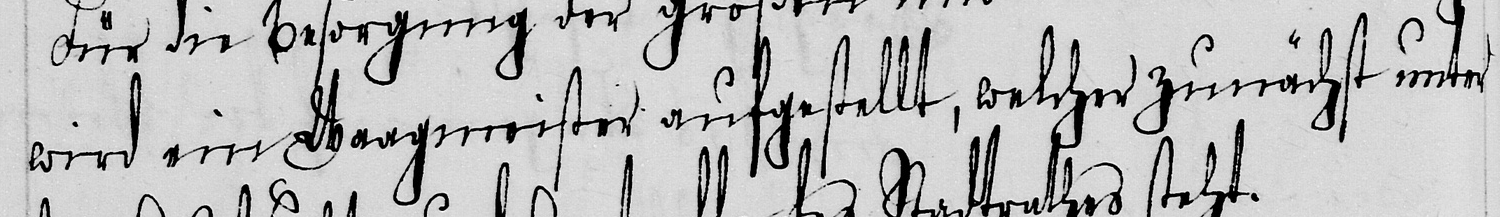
wird ein Waagmeister aufgestellt, welcher zunächst unter
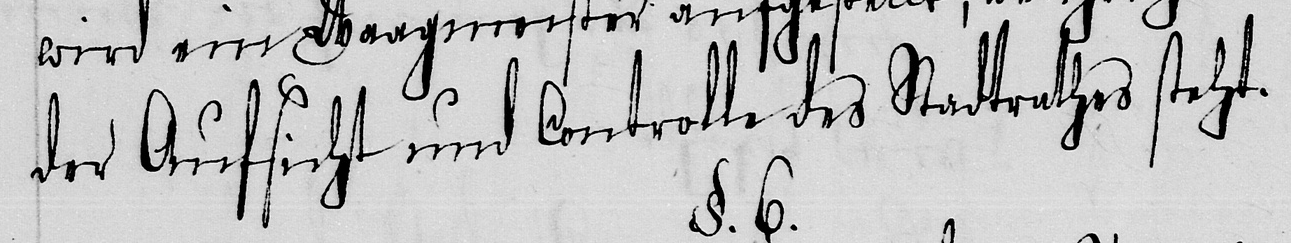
der Aufsicht und Controlle des Stadtrathes steht.
